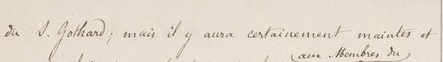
du S. Gothard; mais il y aura certainement maintes et
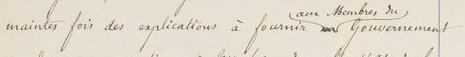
maintes fois des explications à fournir auaux Membres du Gouvernement
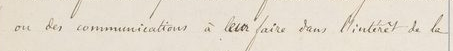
ou des communications à leur faire dans l'intérêt de la
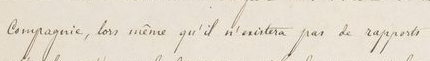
Compagnie, lors même qu'il n'existera pas de rapports
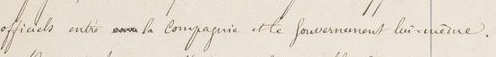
officiels entre nous la Compagnie et le Gouvernement lui-même.
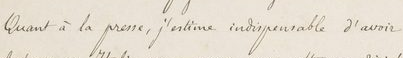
Quant à la presse, j'estime indispensable d'avoir
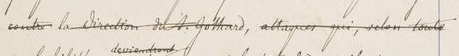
contre la Direction du S. Gothard, attaque qui, selon toute
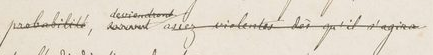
probabilité, deviendront assez violentes dès qu'il s'agira
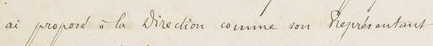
ai proposé à la Direction comme son Représentant
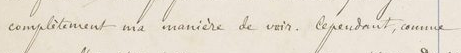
complètement ma manière de voir. Cependant, comme
